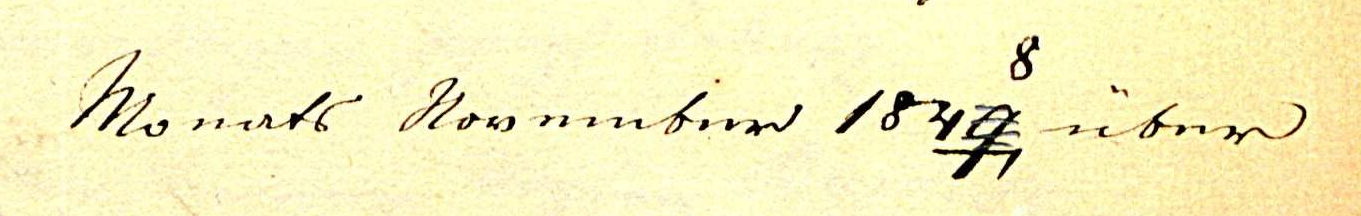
Monats November 1848 über
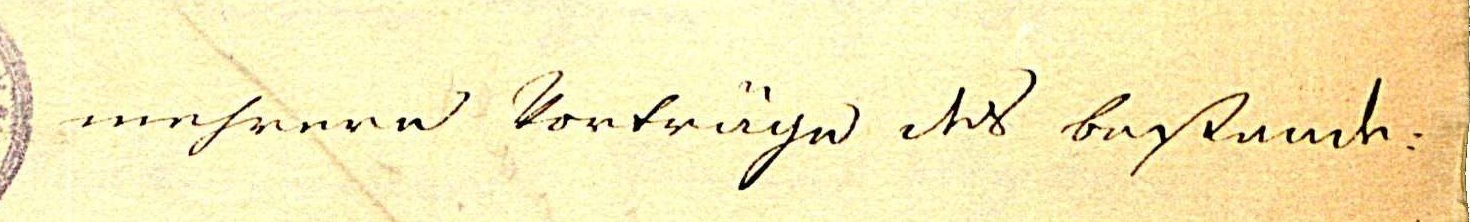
mehrere Vorträge des bestande¬
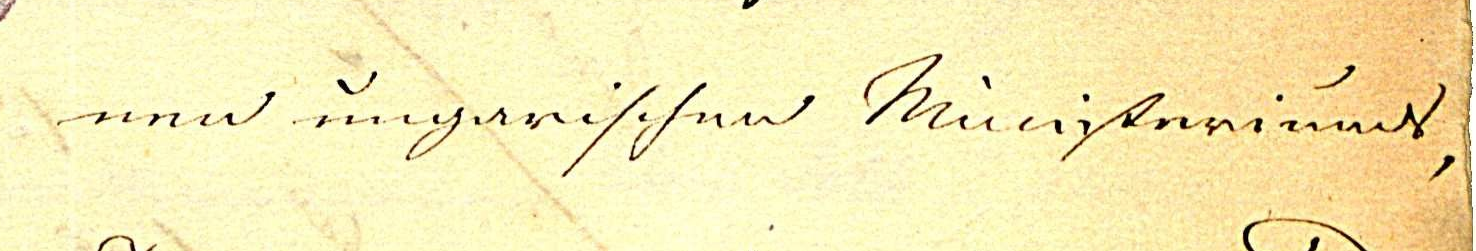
nen ungarischen Ministeriums,
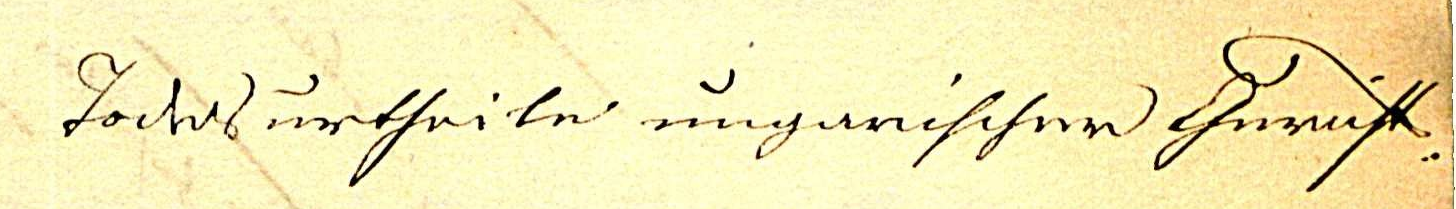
Todesurtheile ungarischer Gerichts¬
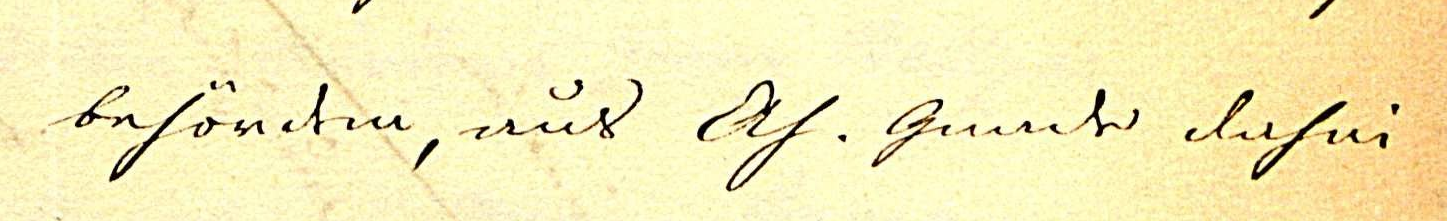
behörden, aus Ah. Gnade dahin
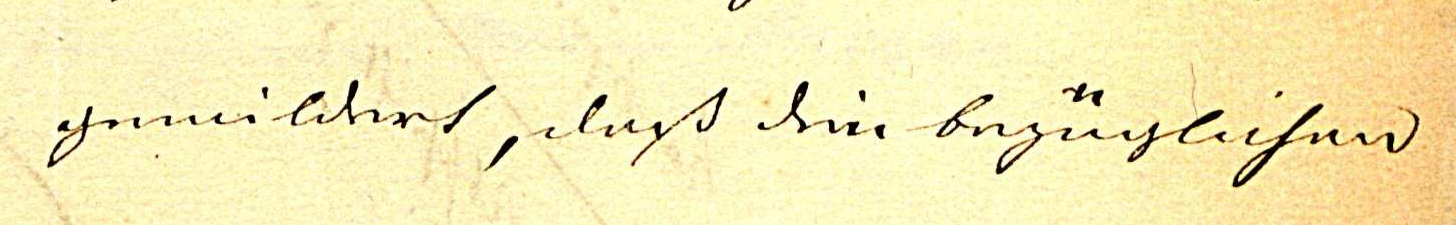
gemildert, daß die bezüglichen
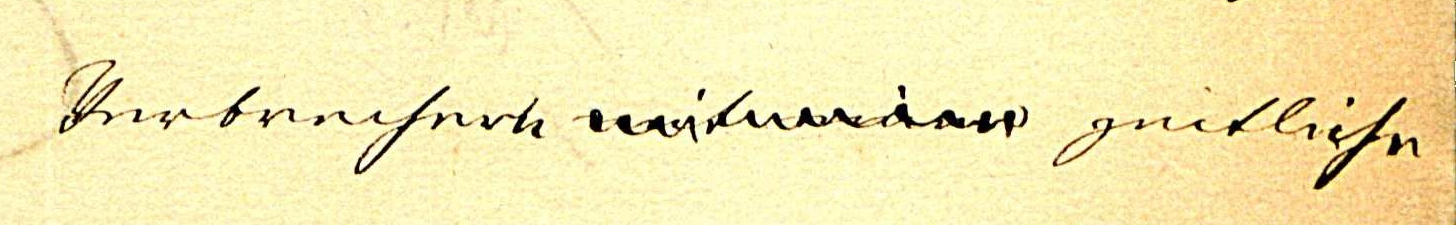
Verbrechern zeitliche
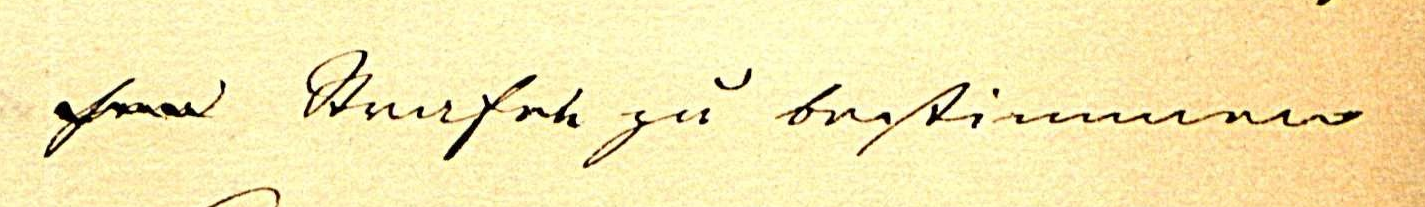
Strafe zu bestimmen
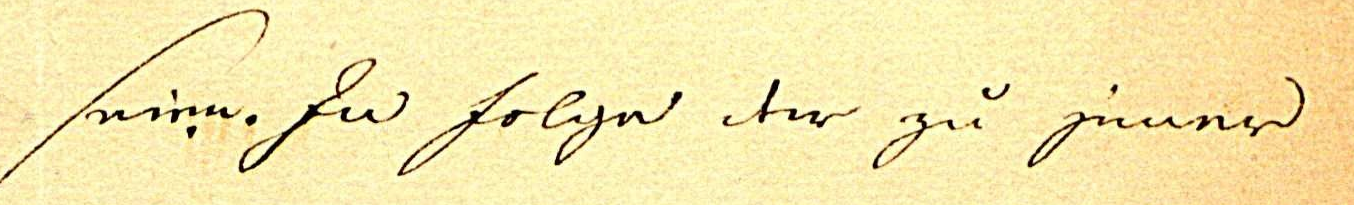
seien. In Folge der zu jener
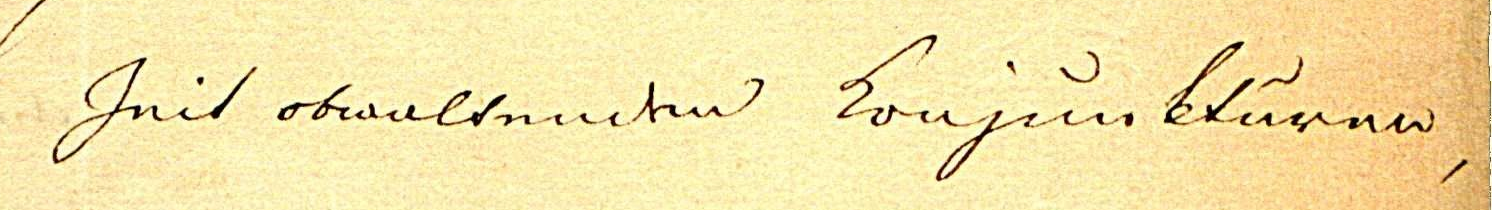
Zeit obwaltenden Konjunkturen,
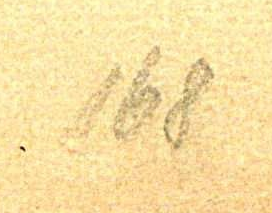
168
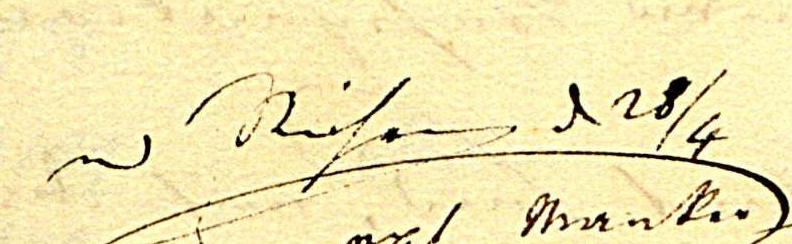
Stiche d 28/4
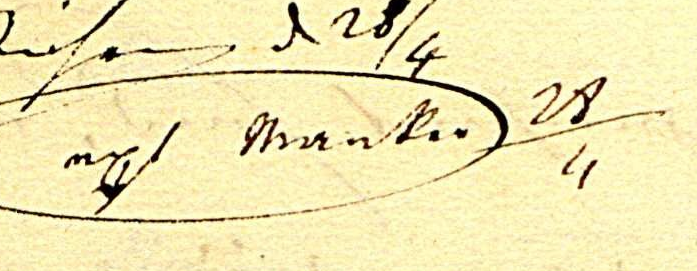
ext Stranke 28/11
